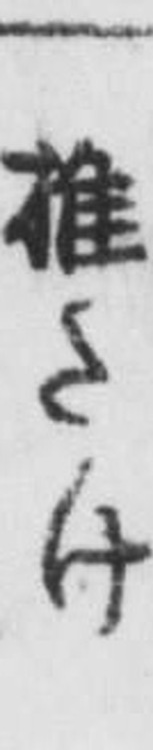椎たけ
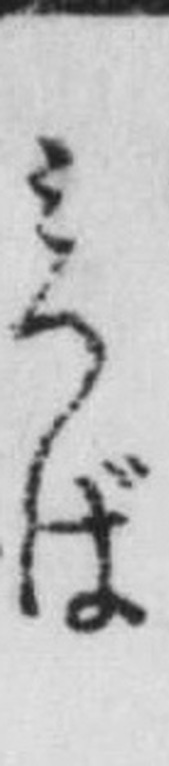みつば
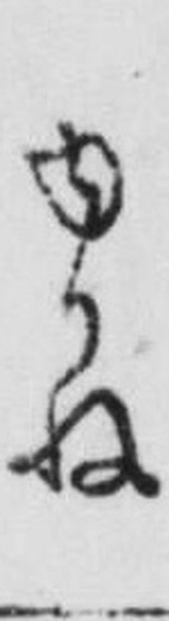ゆりね
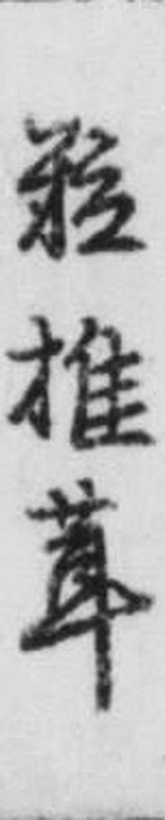粒椎茸
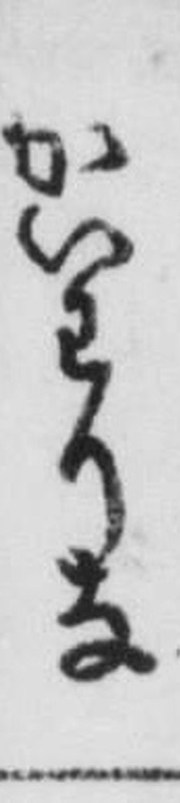かいわりな
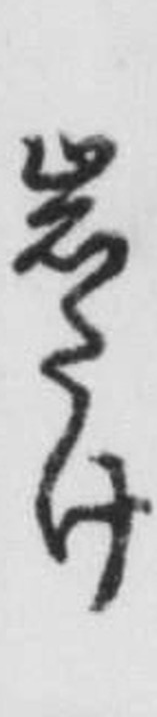岩たけ
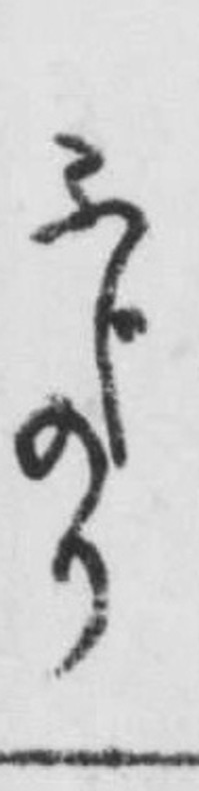ふじのり
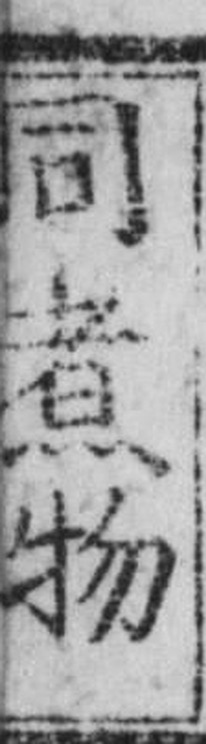同煮物
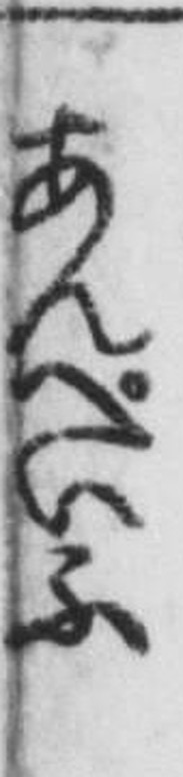あんぺいふ
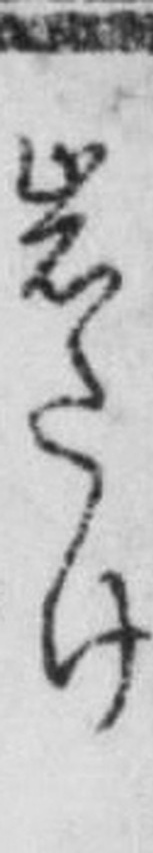岩たけ
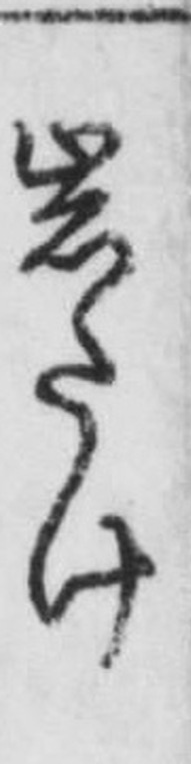岩たけ
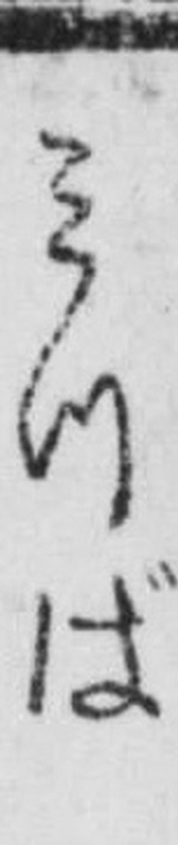みつば
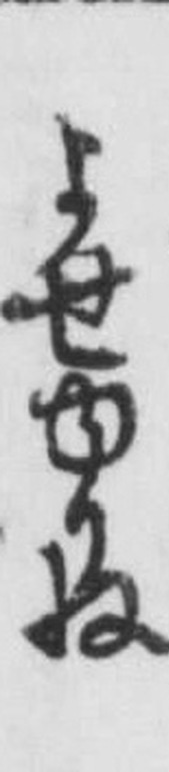よせゆりね
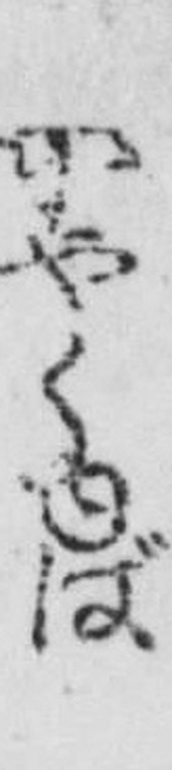かやくゆば
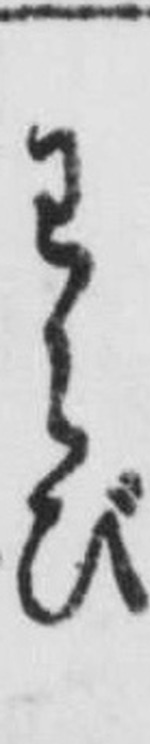わらび
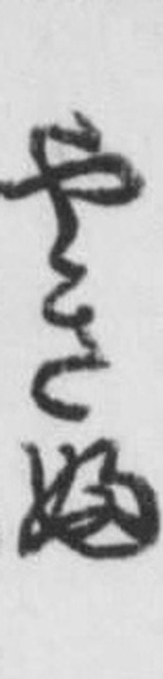やきふ
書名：精進魚類間合料理/早速庖丁
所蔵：大阪府立大学学術情報センター 国文学研究資料館
